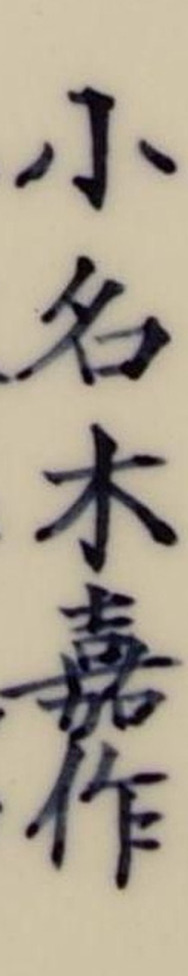小名木嘉作
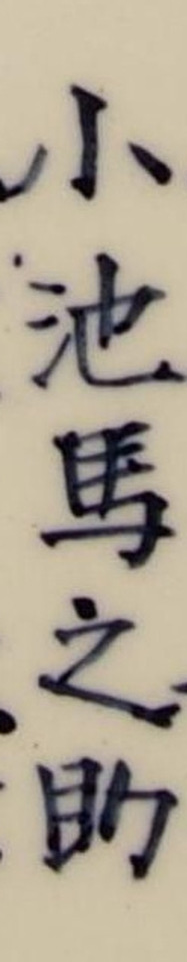小池馬之助
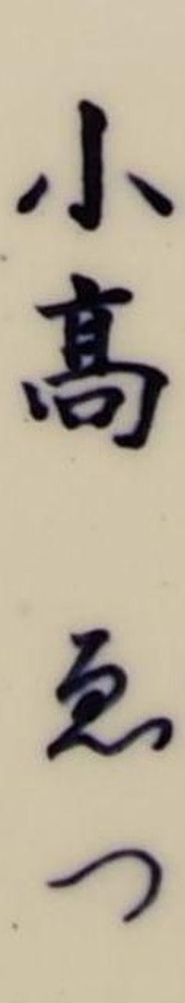小高ゑつ
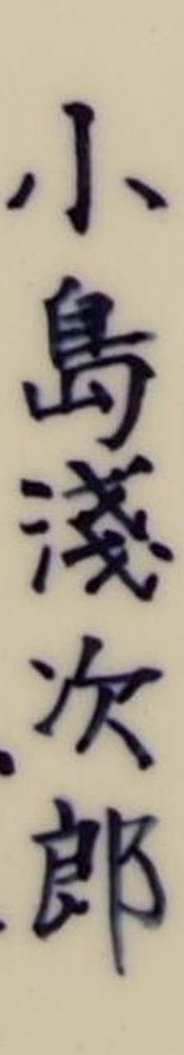小島浅次郎
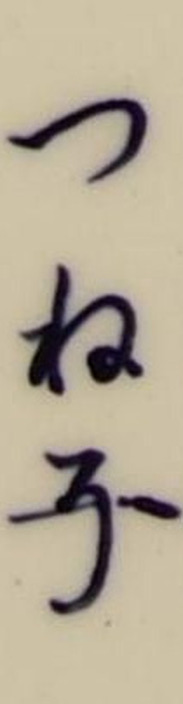つね子
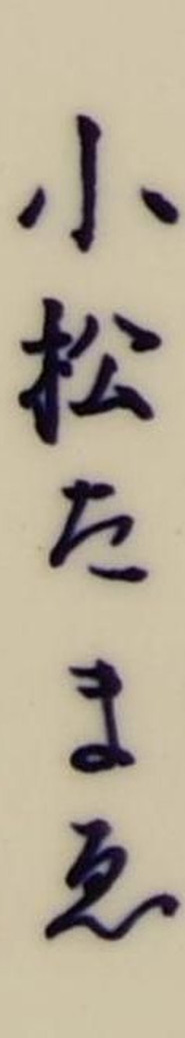小松たまえ

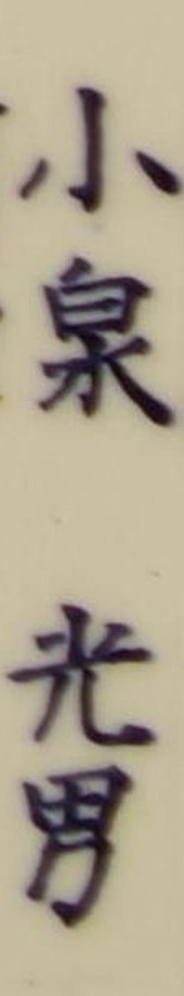小泉光男
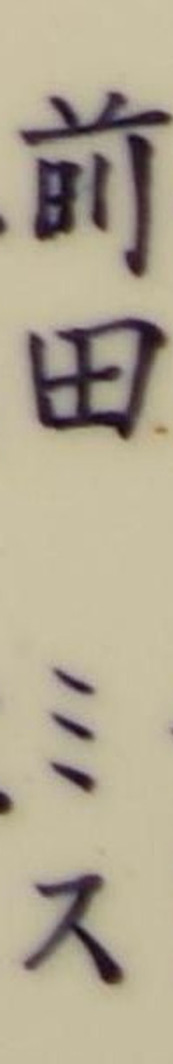前田ミス
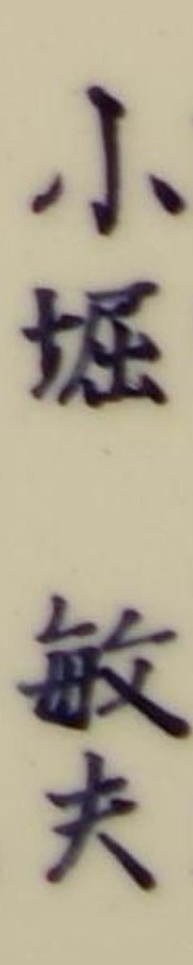小堀敏夫
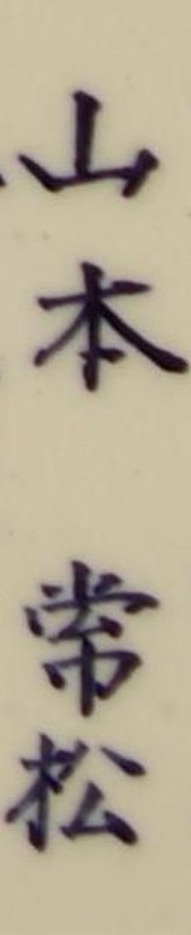山本常松
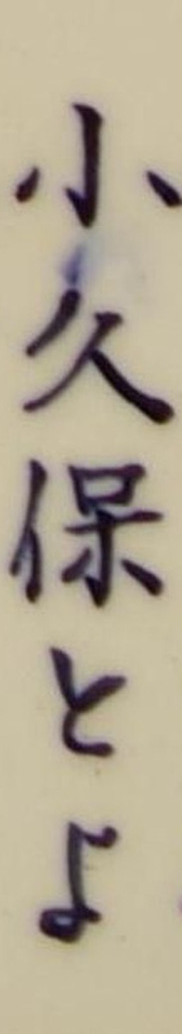小久保とよ
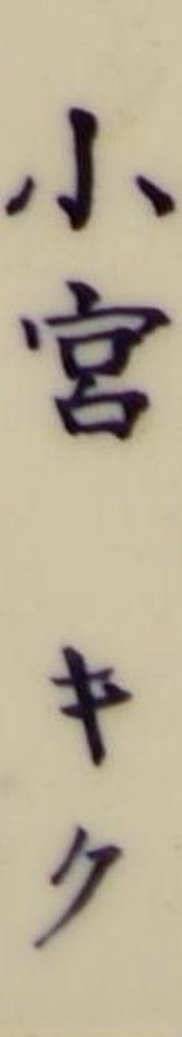小宮キク
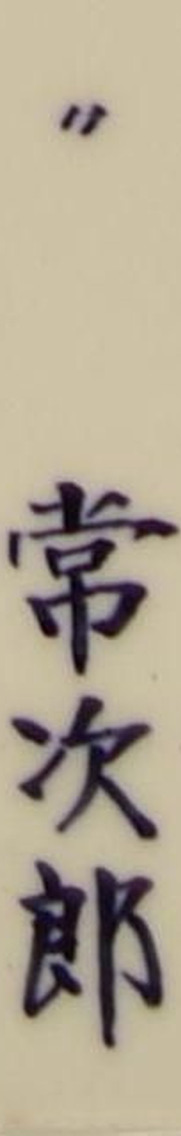常次郎
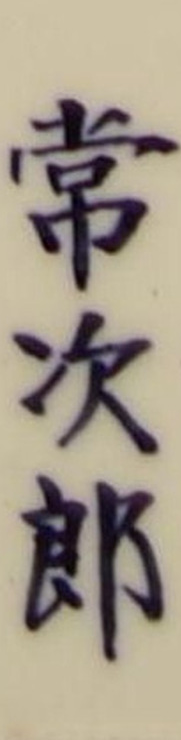常次郎
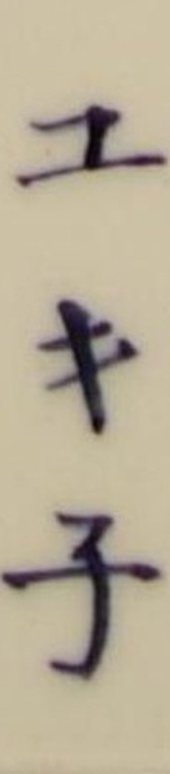ユキ子
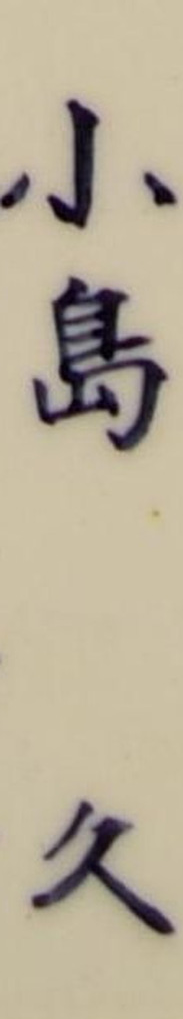小島久
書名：E~L
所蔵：高野山金剛峯寺
